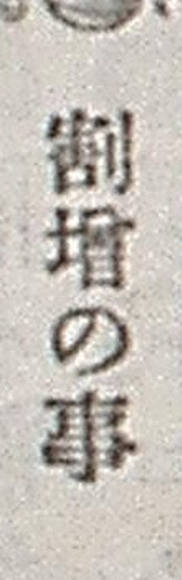割増の事
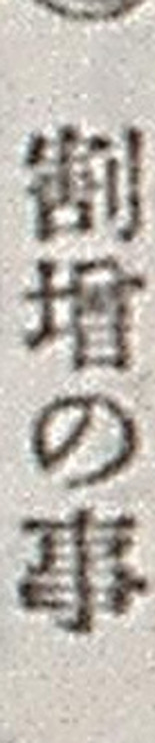割増の事
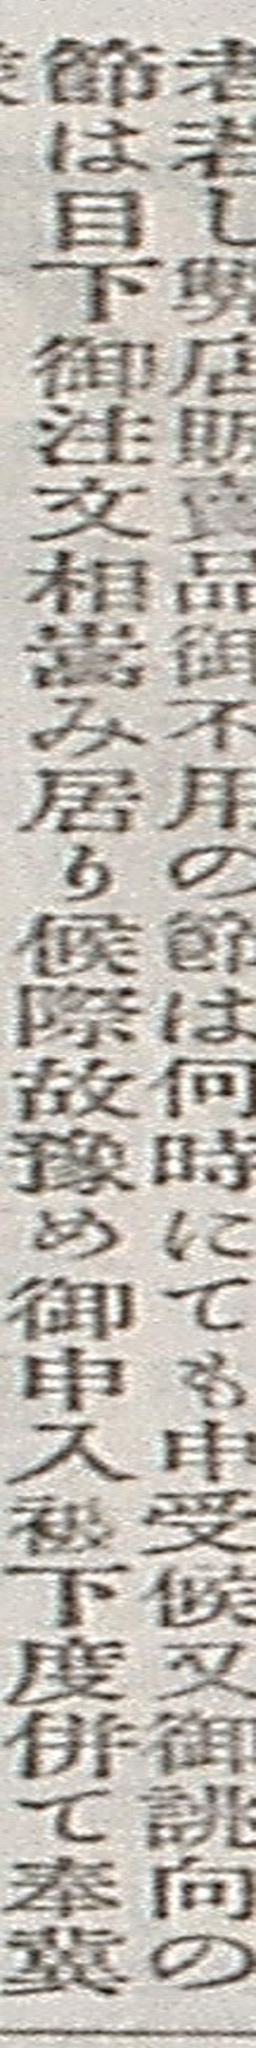節は目下御注文相嵩み居り候際故予め御申入被下度併て奉冀
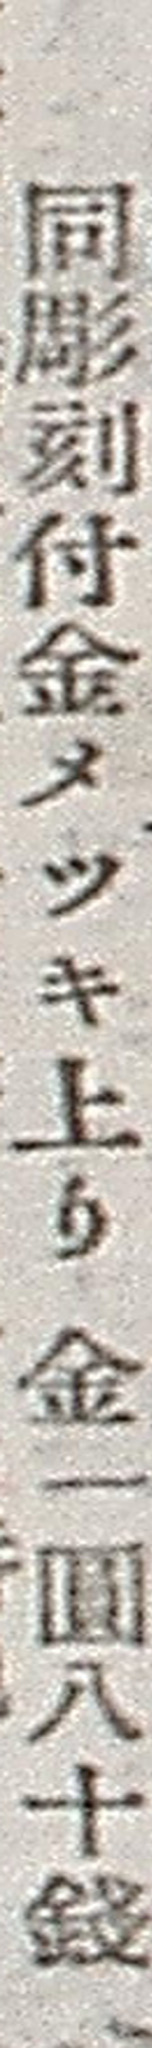同彫刻付金メッキ上り金一円八十銭
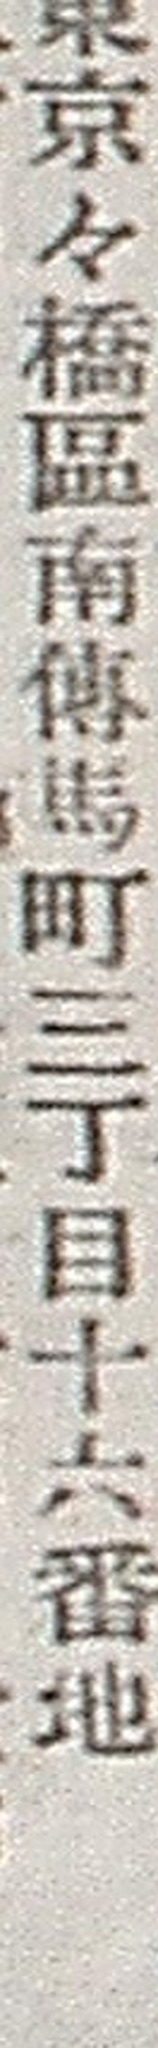東京々橋区南伝馬町三丁目十六番地
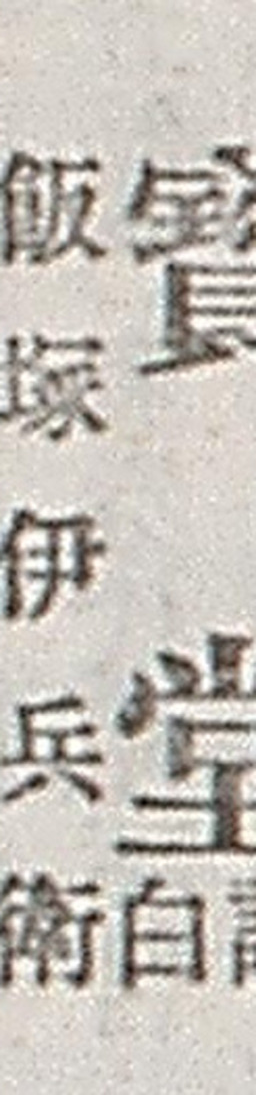飯塚伊兵衛
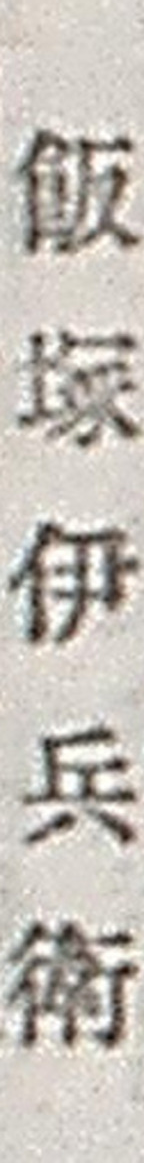飯塚伊兵衛
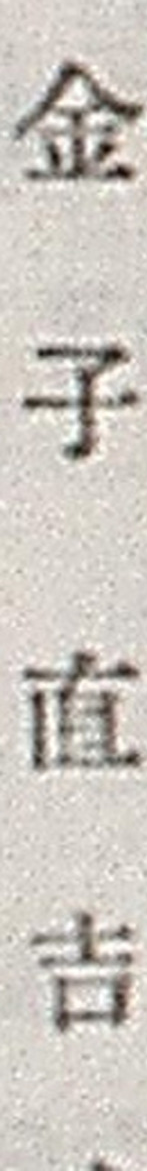金子直吉

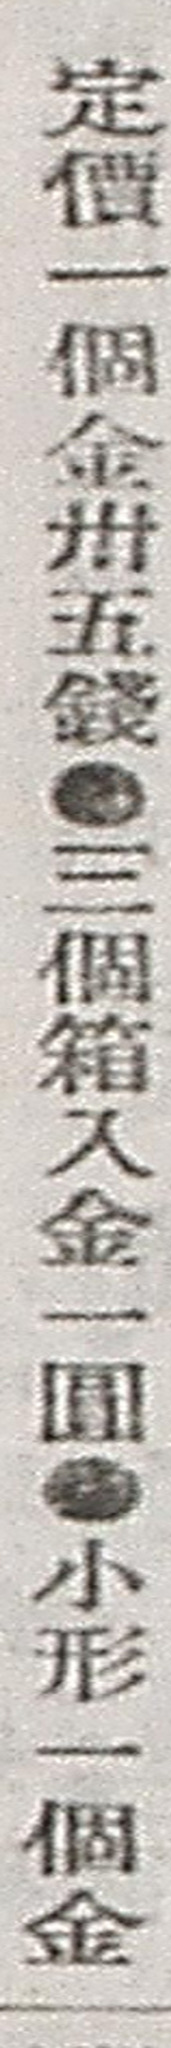定価一個金卅五銭●三個箱入金一円●小形一個金
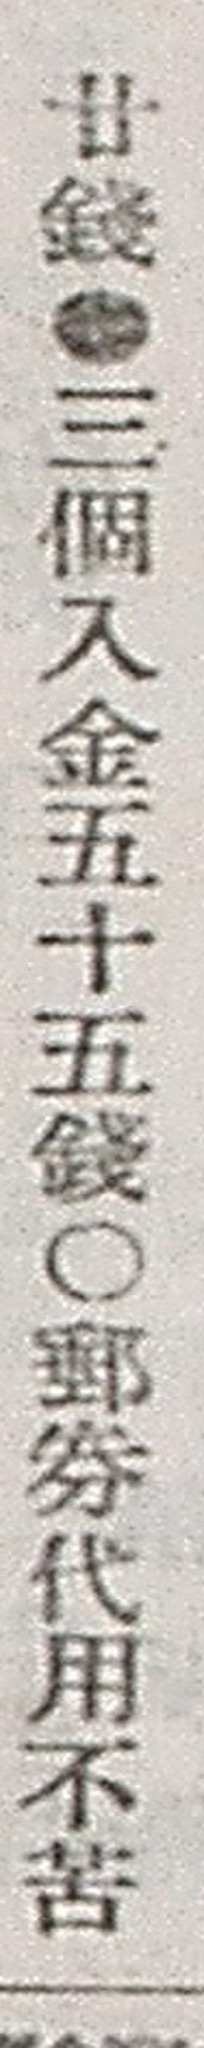廿銭●三個入金五十五銭●郵券代用不苦
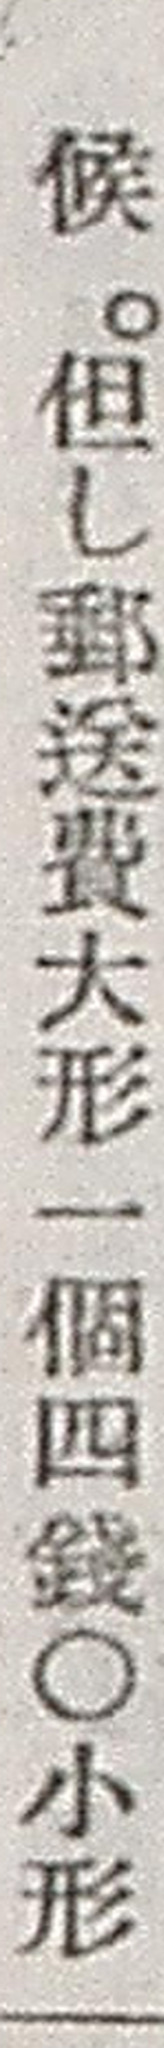候。但し郵送費大形一個四銭〇小形
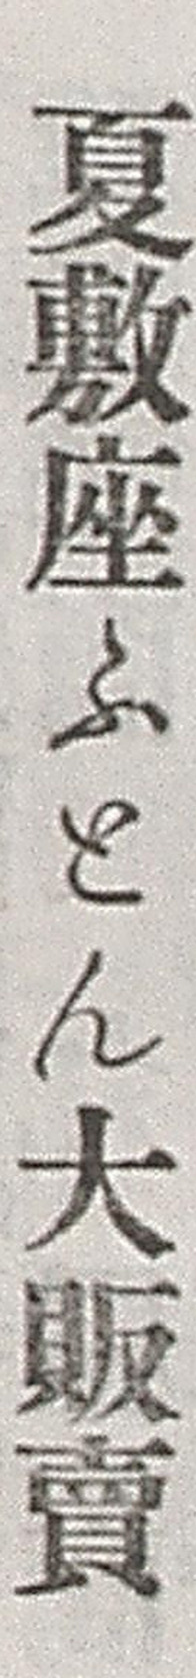夏敷座ふとん大販売
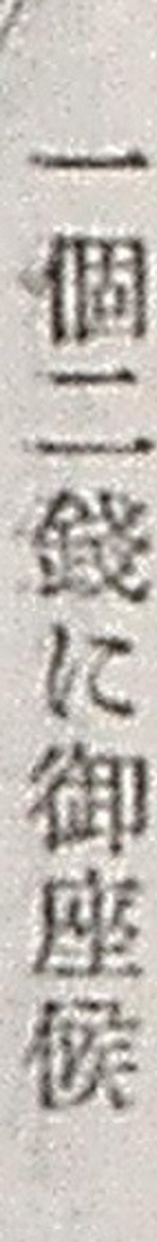一個二銭に御座候
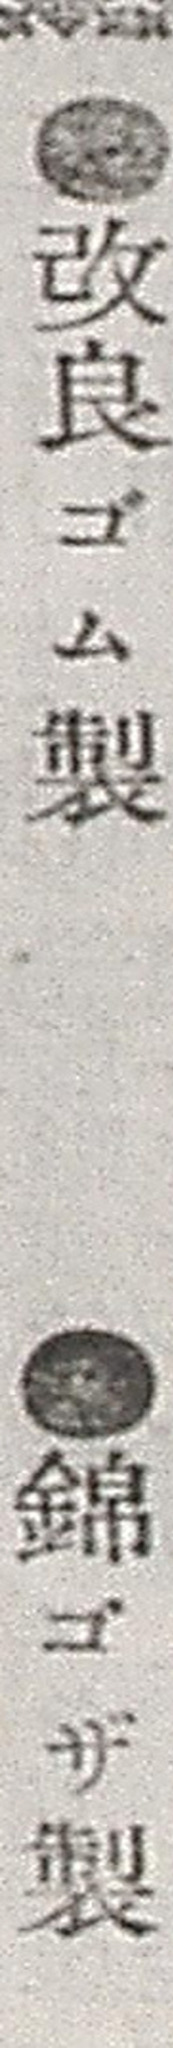●改良ゴム製●錦ゴザ製
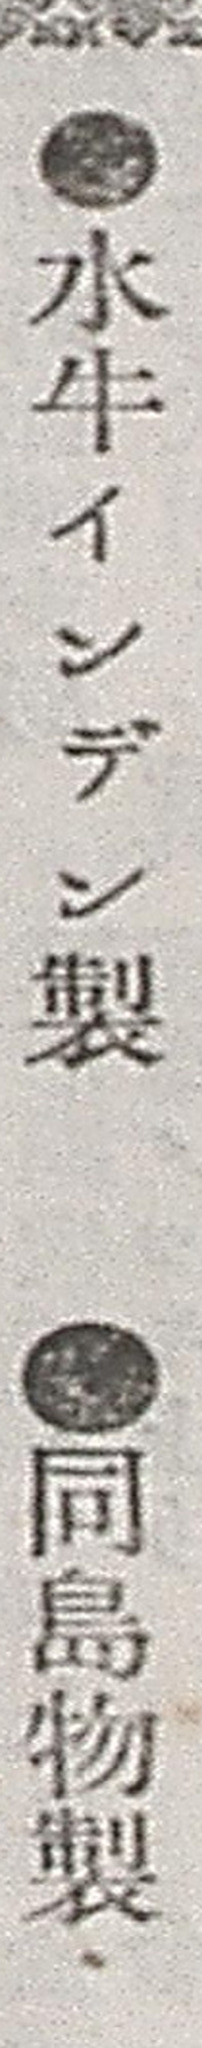●水牛インデン製●同島物製
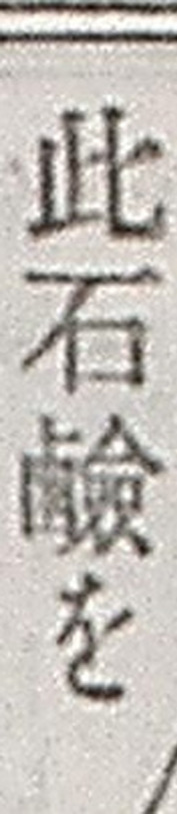此石鹸を
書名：風俗畫報臨時増刊第百二十號　大海嘯被害録（下）
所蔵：東京大学地震研究所図書室 Earthquake Research Institute Library, The University of Tokyo, JAPAN
